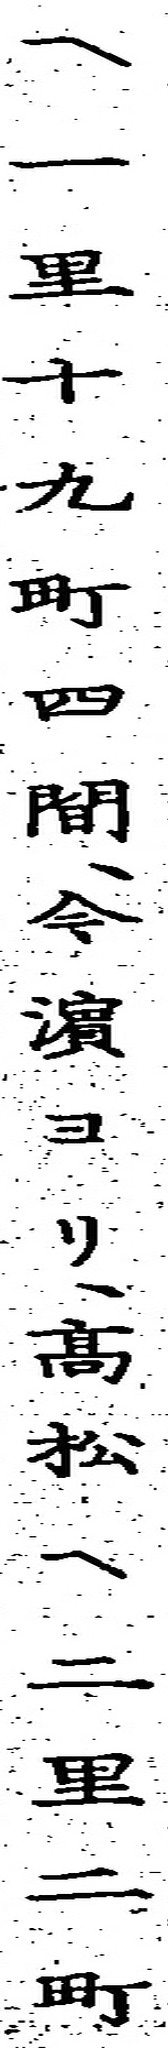ヘ一里十九町四間、今浜ヨリ、高松ヘ二里二町
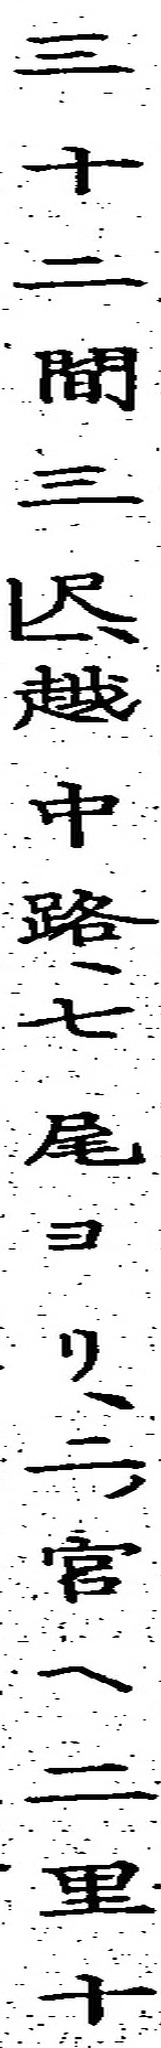三十二間三尺」、越中路、七尾ヨリ、二宮へ二里十
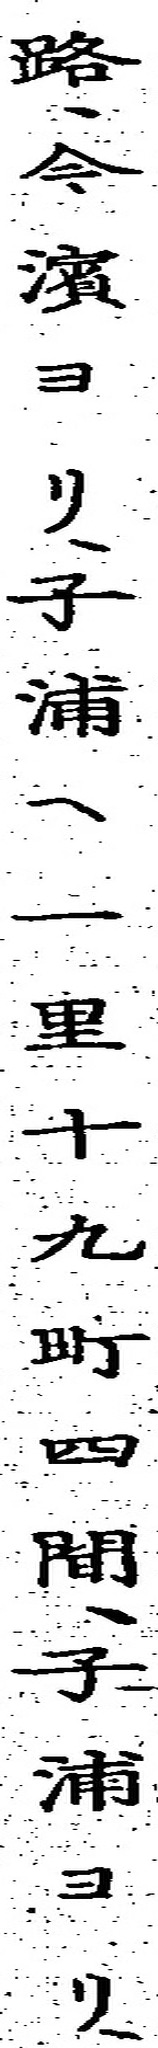路、今浜ヨリ、子浦ヘ一里十九町四間、子浦ヨリ、
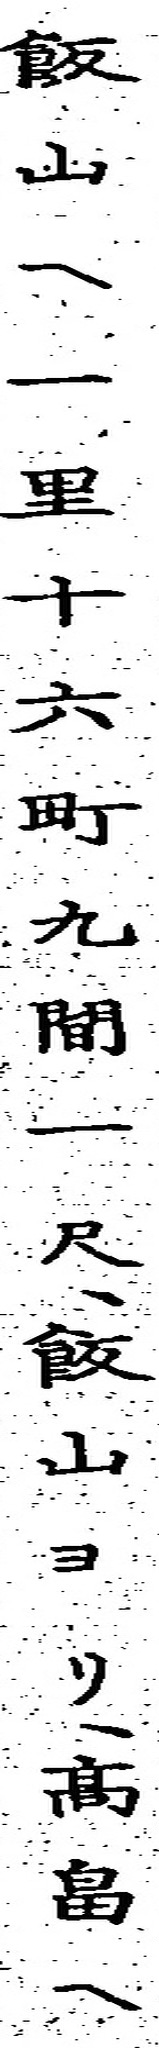飯山ヘ一里十六町九間一尺、飯山ヨリ、高畠ヘ
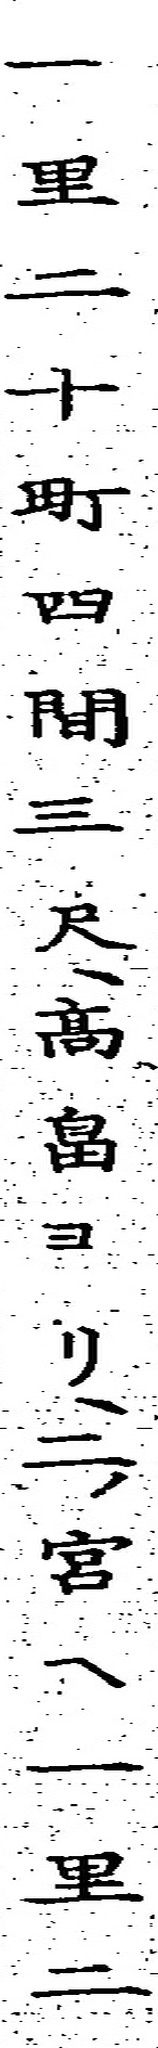一里二十町四間三尺、高畠ヨリ、二宮ヘ一里二
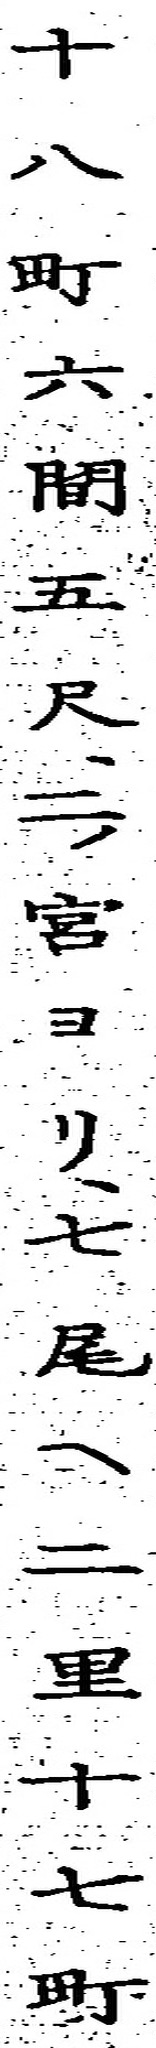十八町六間五尺、二宮ヨリ、七尾ヘ二里十七町
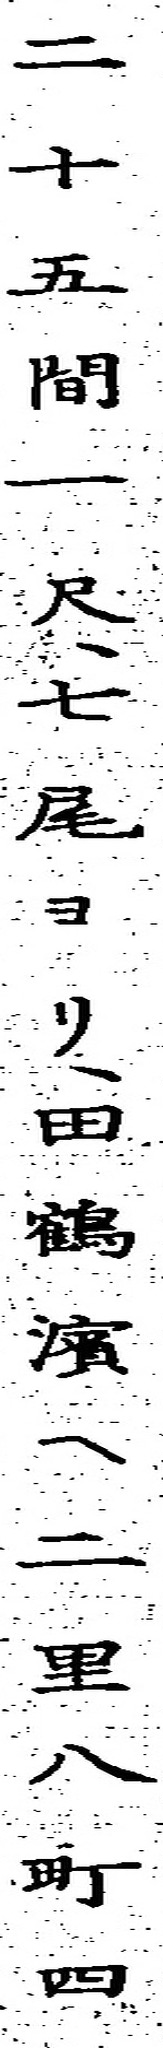二十五間一尺、七尾ヨリ、田鶴浜ヘ二里八町四
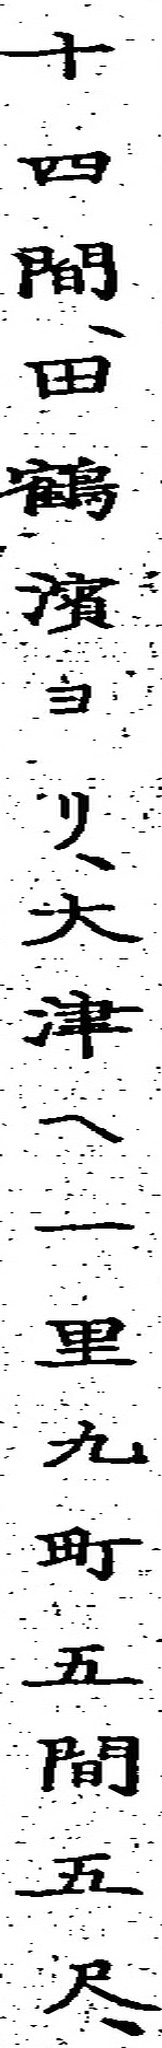十四間、田鶴浜ヨリ、大津ヘ一里九町五間五尺、
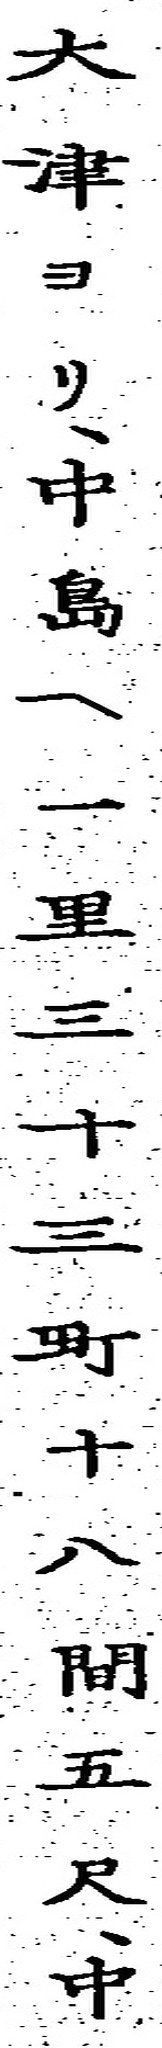大津ヨリ、中島ヘ一里三十三町十八間五尺、中
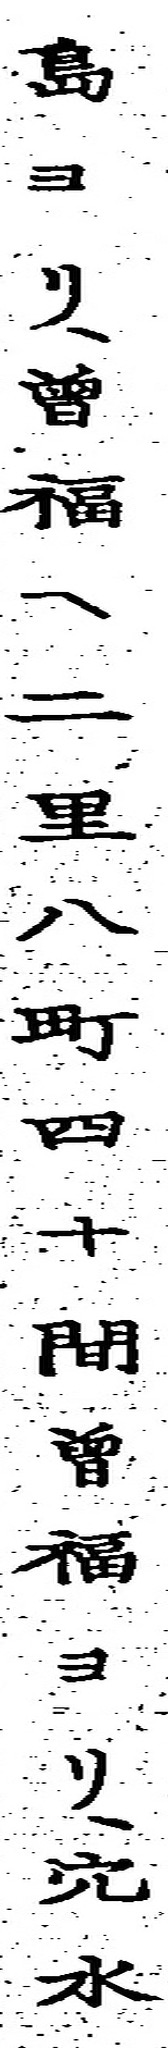島ヨリ、曽福ヘ二里八町四十間曽福ヨリ、穴水
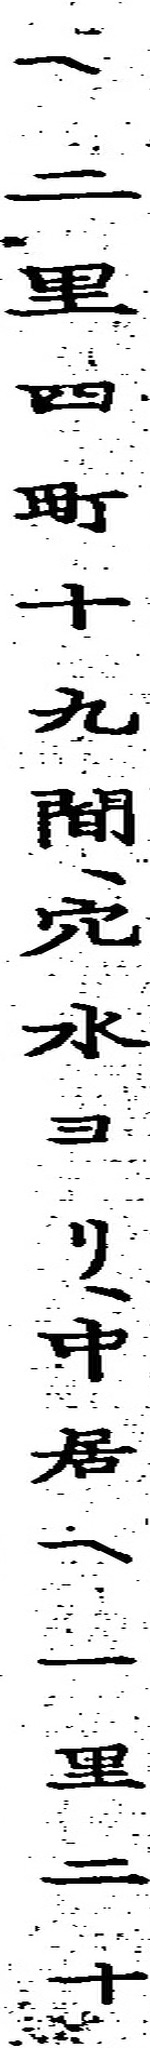ヘ二里四町十九間、穴水ヨリ、中居ヘ一里二十
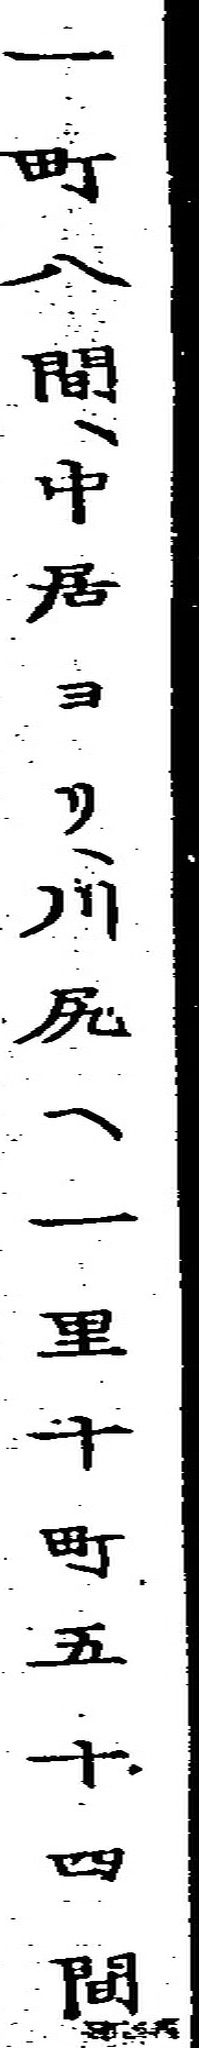一町八間、中居ヨリ、川尻ヘ一里十町五十四間
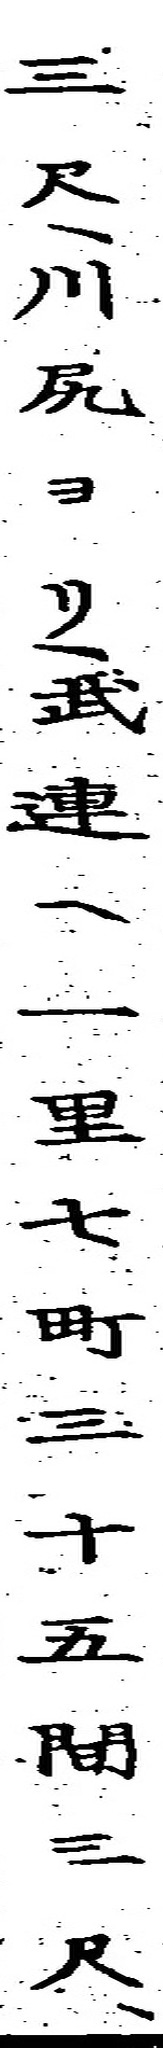三尺、川尻ヨリ、武連ヘ一里七町三十五間三尺、
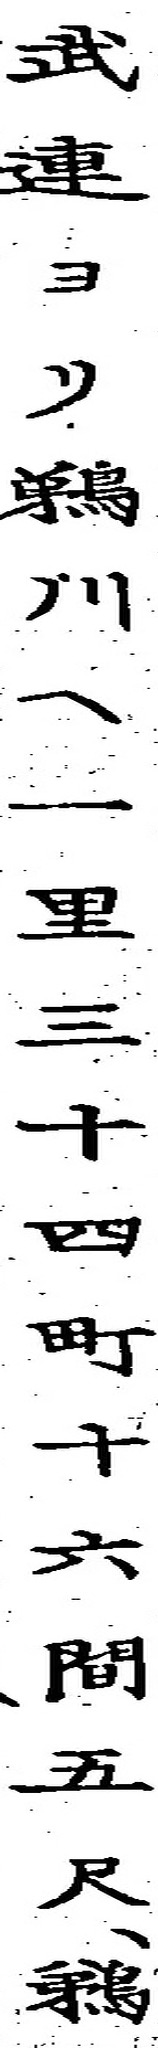武連ヨリ鵜川ヘ一里三十四町十六間五尺、鵜
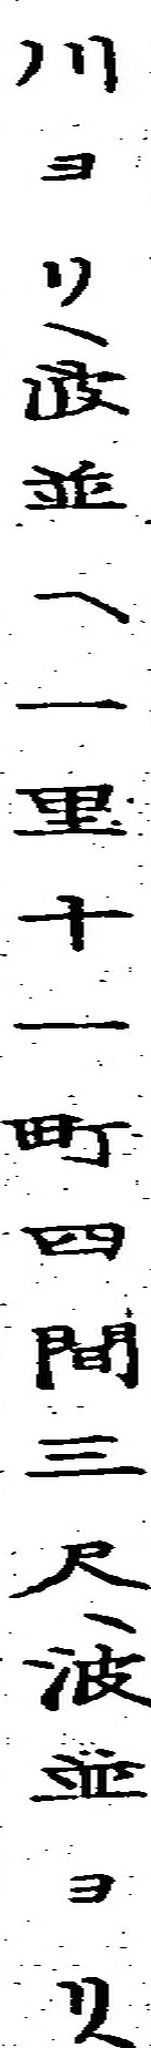川ヨリ、波並ヘ一里十一町四間三尺、波並ヨリ、
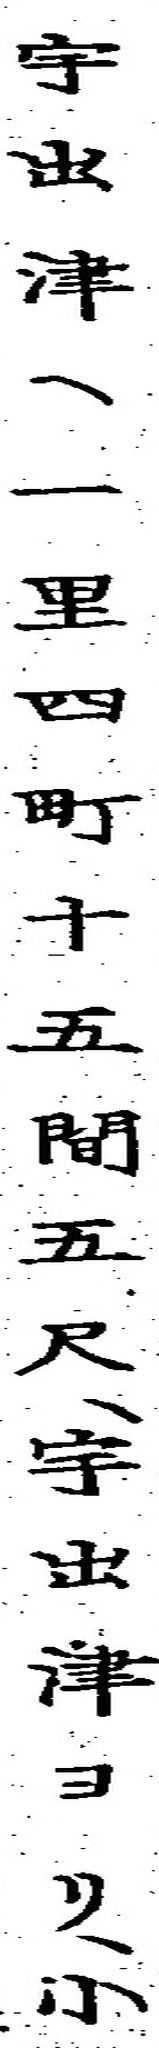宇出津ヘ一里四町十五間五尺、宇出津ヨリ、小
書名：能登地誌略
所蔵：国立国会図書館 National Diet Library, JAPAN
